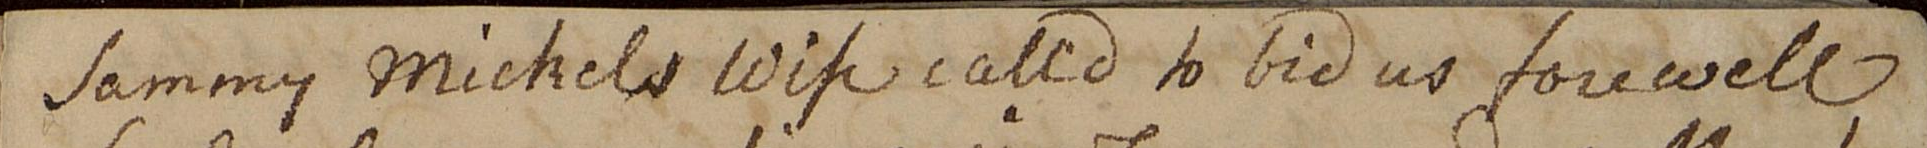Sammy Michels Wife call'd to bid us forewell,
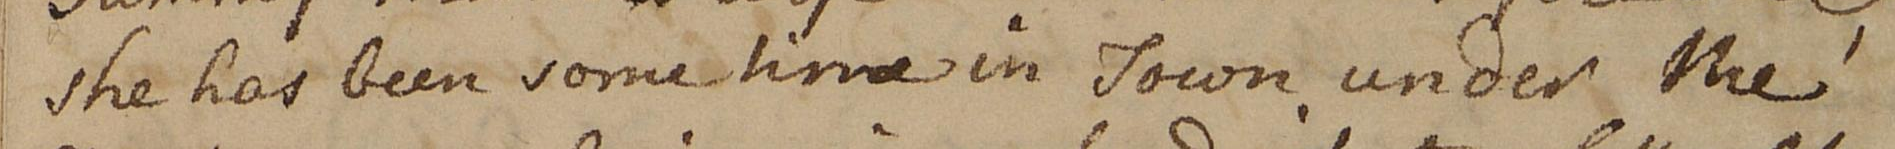she has been some time in Town, under the
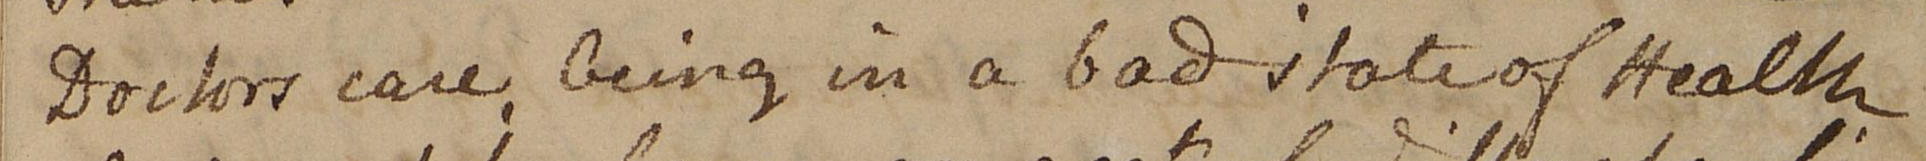Doctors care, being in a bad state of Health,
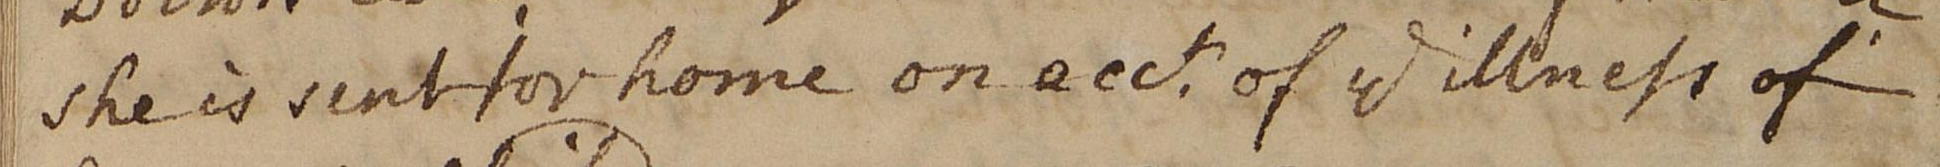she is sent for home on acc^t. of y^e illness of
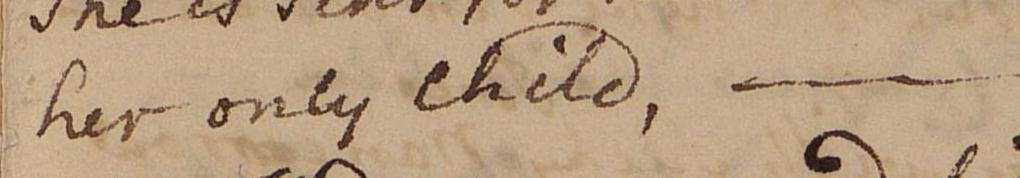her only child,-
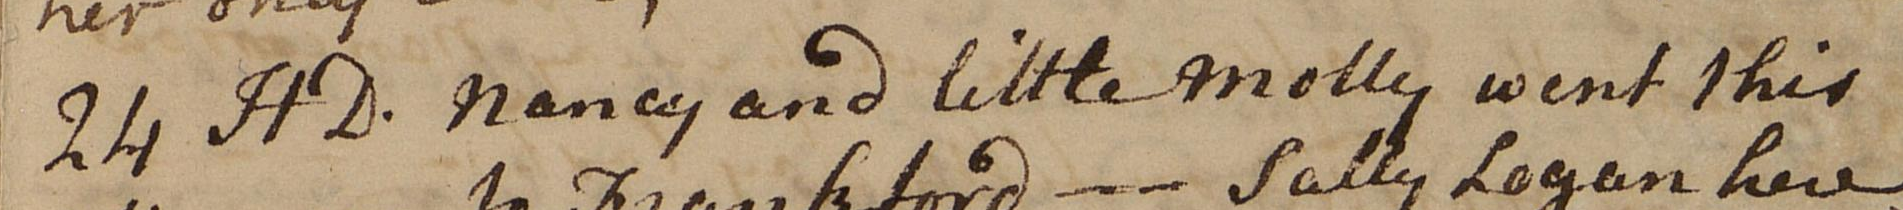24 HD. Nancy and little Molly went this
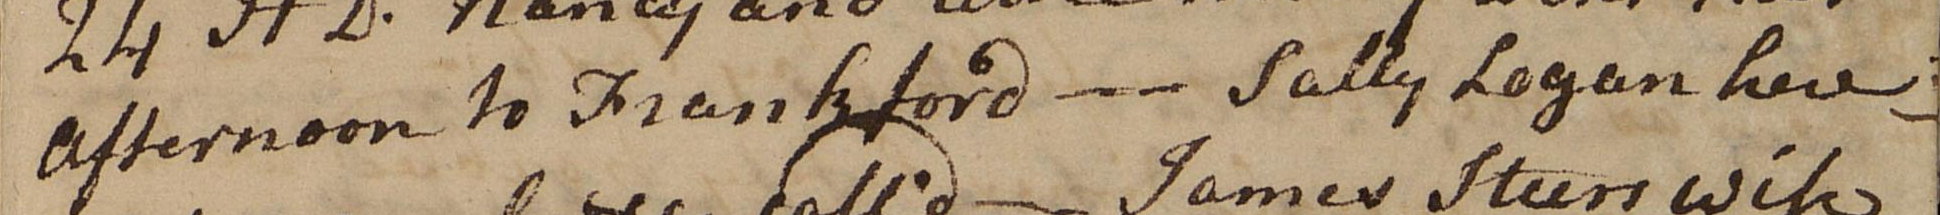Afternoon to Frankford-- Sally Logan here
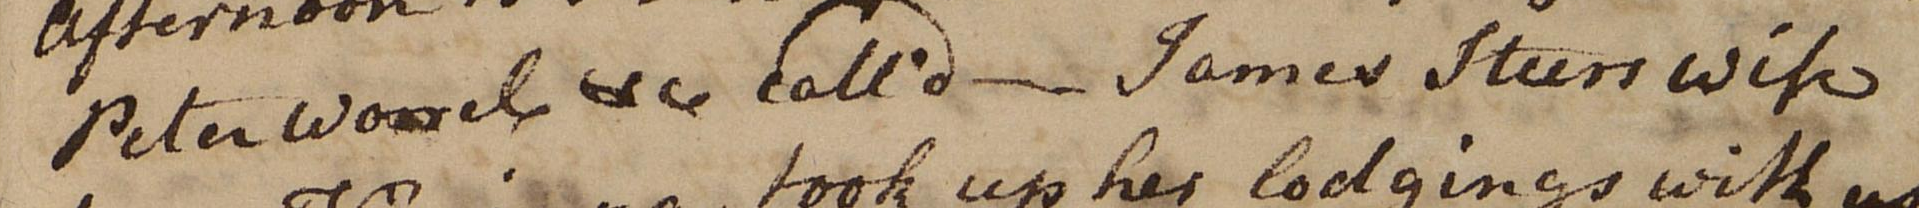Peter Worrel &c call'd- James Steers wife
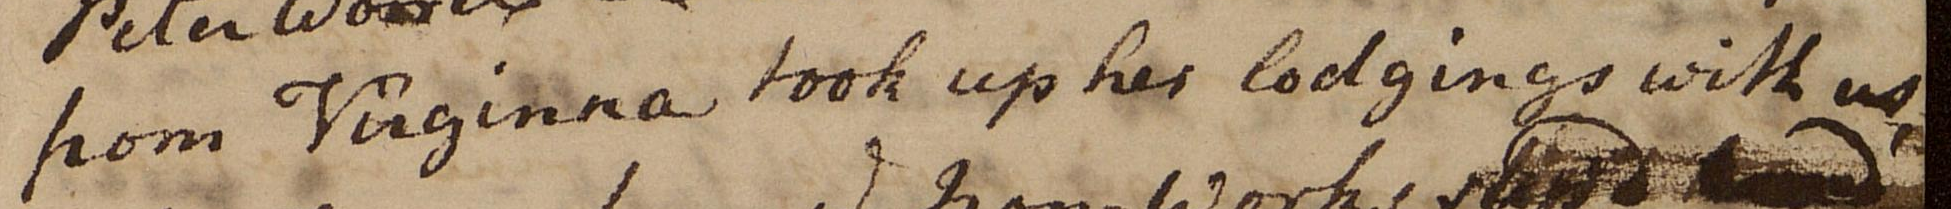from Virginna took up her lodgings with us,
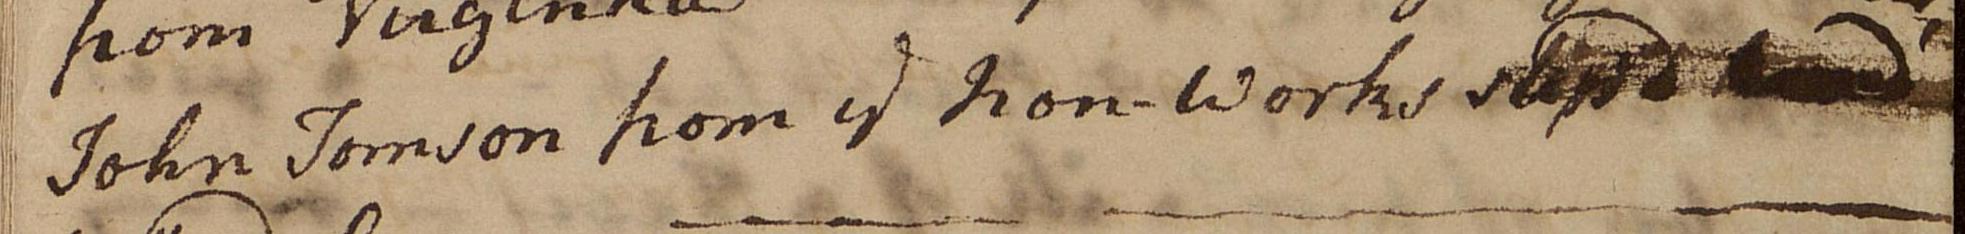John Tomson from y^e Iron-Works [stopd and]
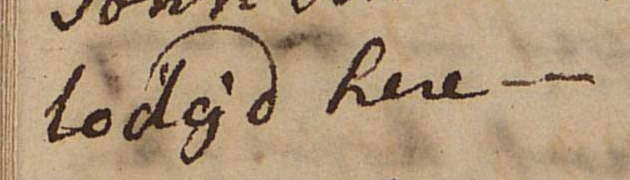lodg'd here-
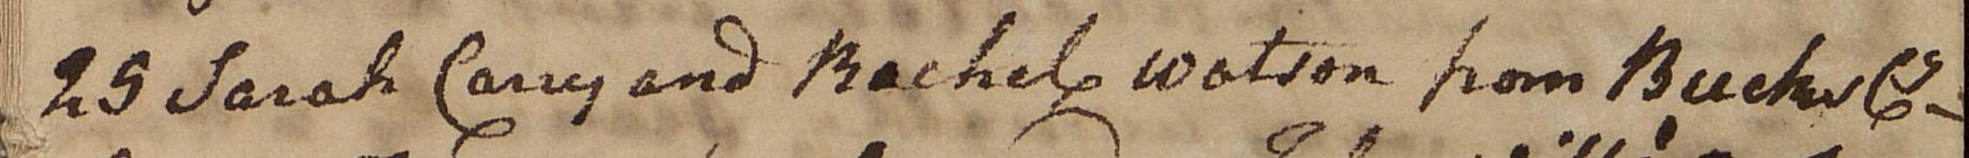25 Sarah Carry and Rachel Watson from Bucks C^y-
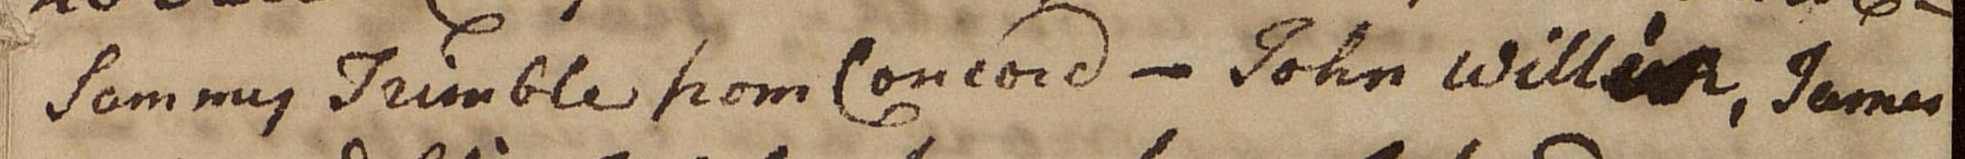Sammy Trimble from Concord- John Willim, James
